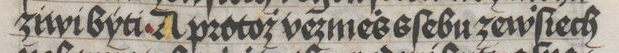ziwi byti.A protoż vezmeṡ sſebu zewẛiech
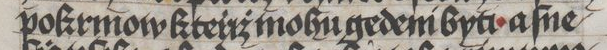pokrmow kteṙiż mohu gedeni byti.a ſne¬
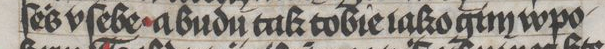ſeṡ vſebe.a budu tak tobie iako gim wpo¬
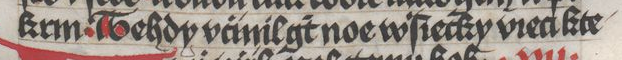krm.Tehdy vċinil ḡt noe wẛiecky vieci kte¬
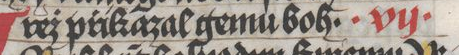reż pṙíkazal gemu boh. .vij.
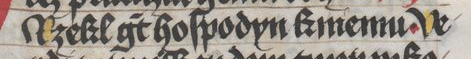Rżekl ḡt hoſpodyn kníemu.Ve¬
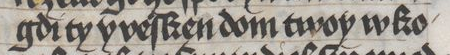gdi ty y veẛken dóm twoy w ko¬
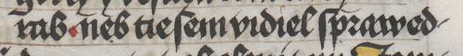rab.neb tie ſem vidiel ſprawed¬
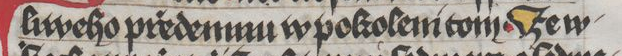liweho pṙedemnu w pokolení tom.Ze w¬
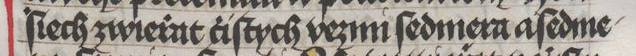ẛiech zwieṙat ċiſtych yezmi ſedmera a ſedme¬
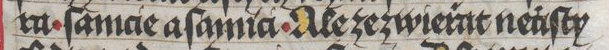ra. ſamcie a ſamici.Ale że zwieřat neċiſty¬
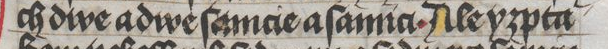ch dwe a dwe ſamcie a ſamici.Ale yzpta¬
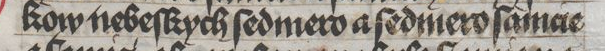kow nebeſkych ſedmero a ſedmero ſamcie
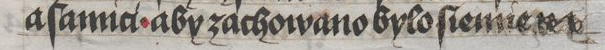a ſamici.aby zachowano bylo ſiemie we p¬
